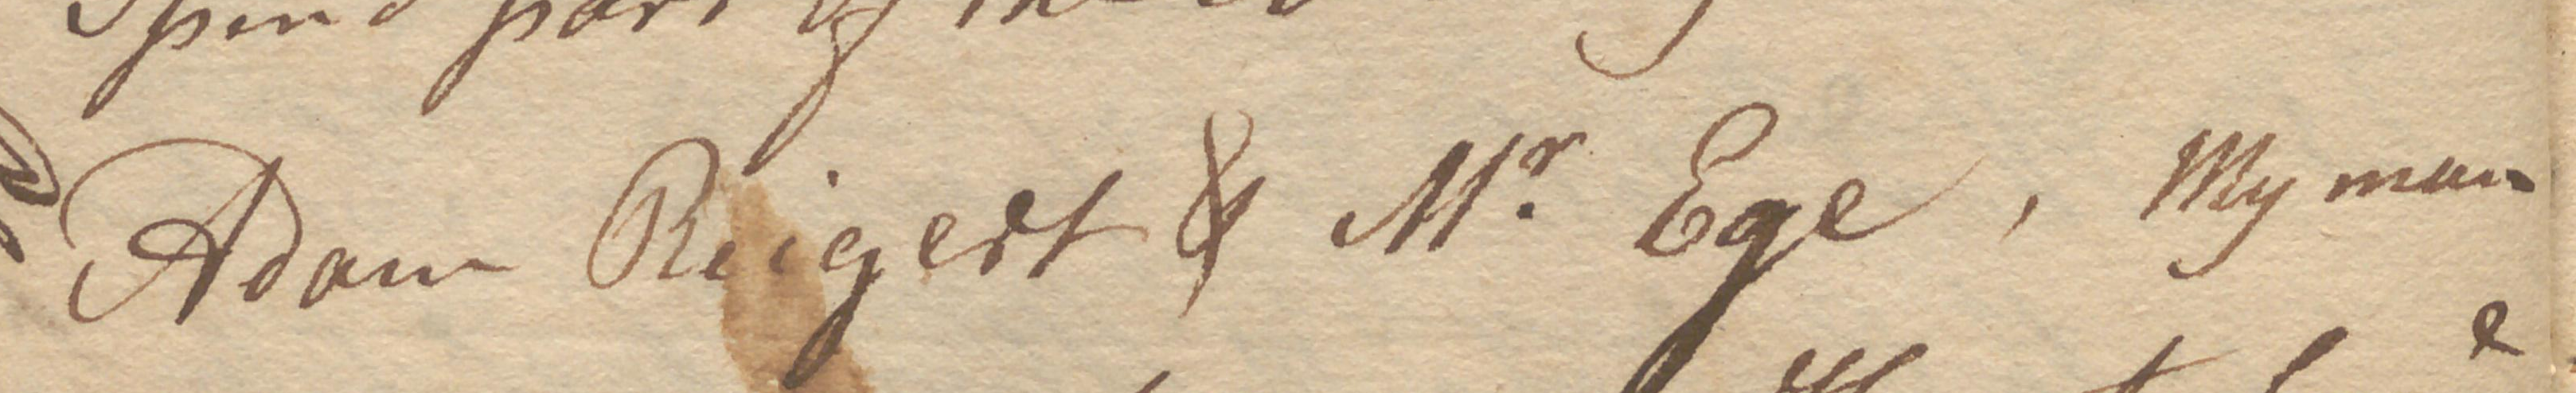Adam Reigert & M^r. Ege, My man
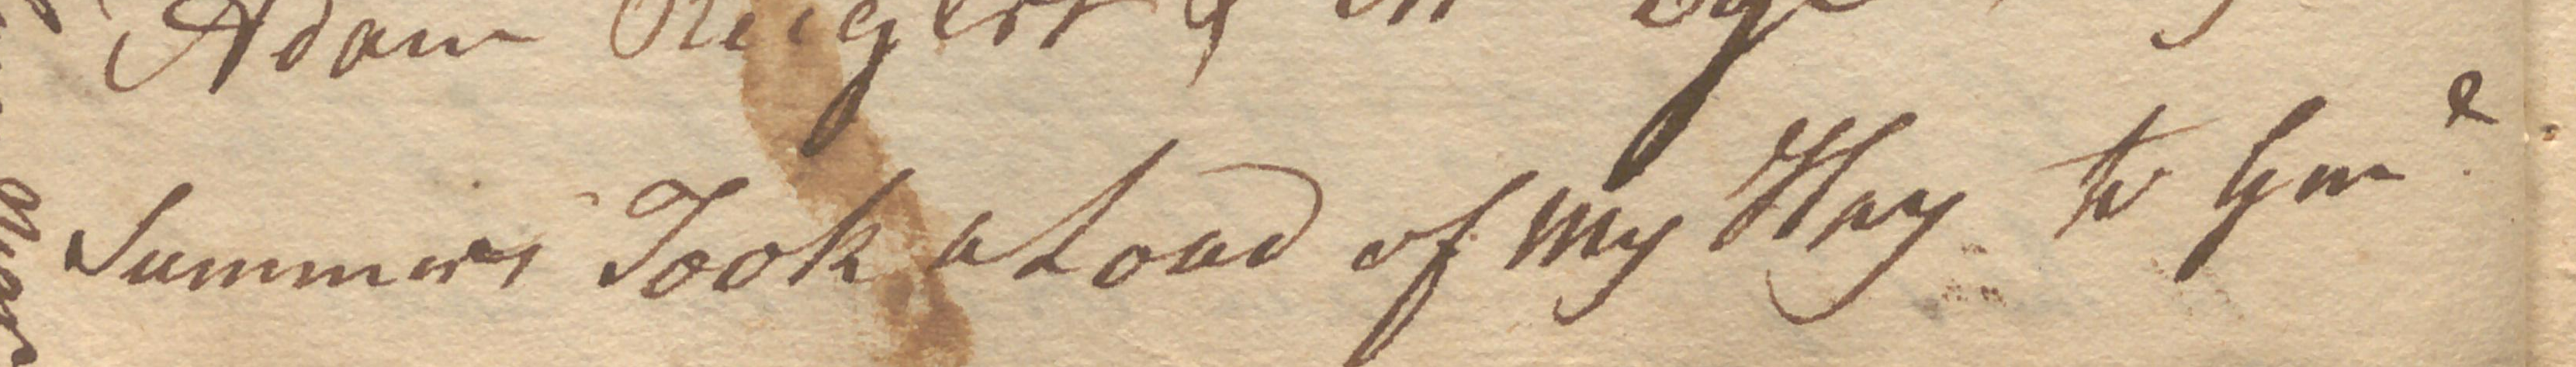Summers Took a Load of My Hay to Gen^l.
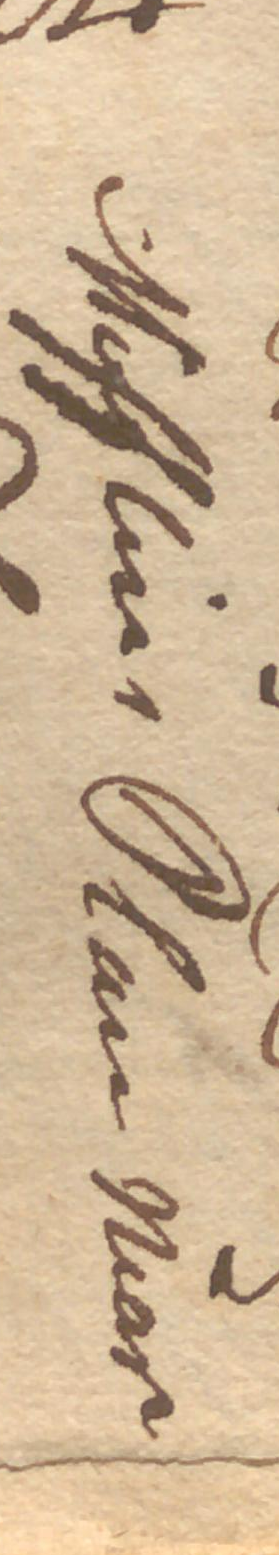Wifflins Plan near
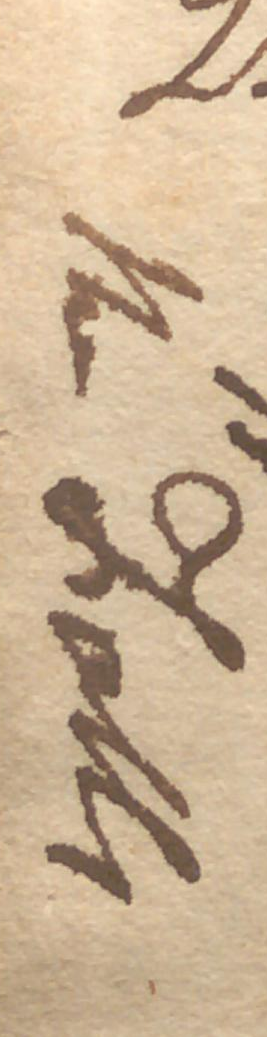the Falls
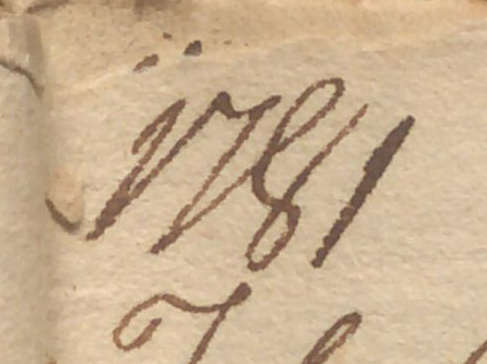1781
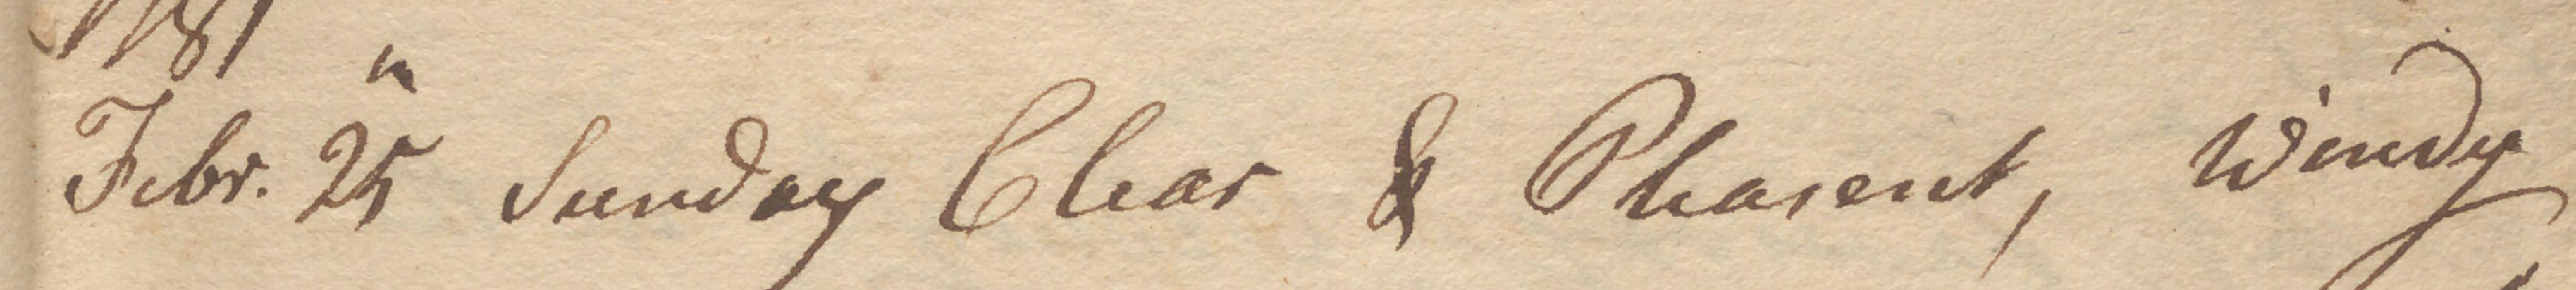Febr. 25 Sunday Clear & Pleasent, Windy
